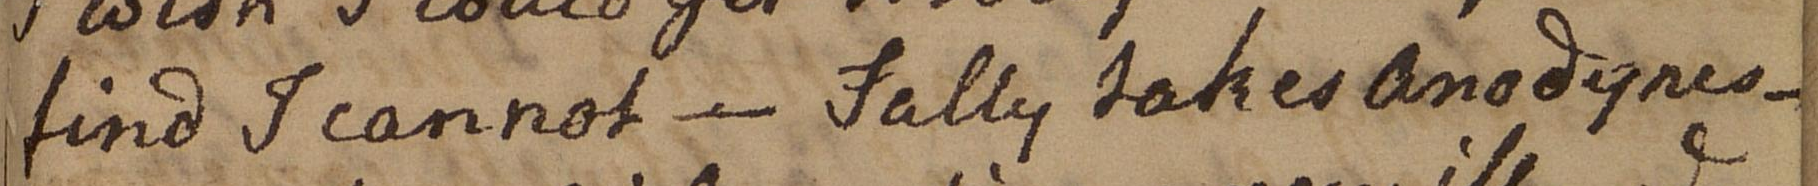find I cannot- Sally takes Anodynes.
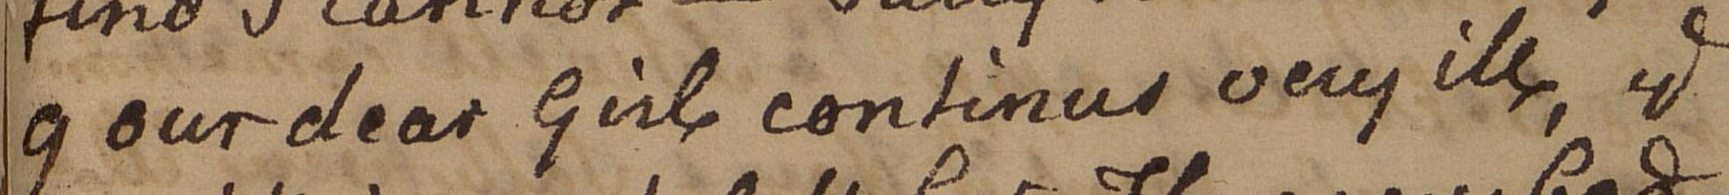9 our dear Girl continus very ill, y^e
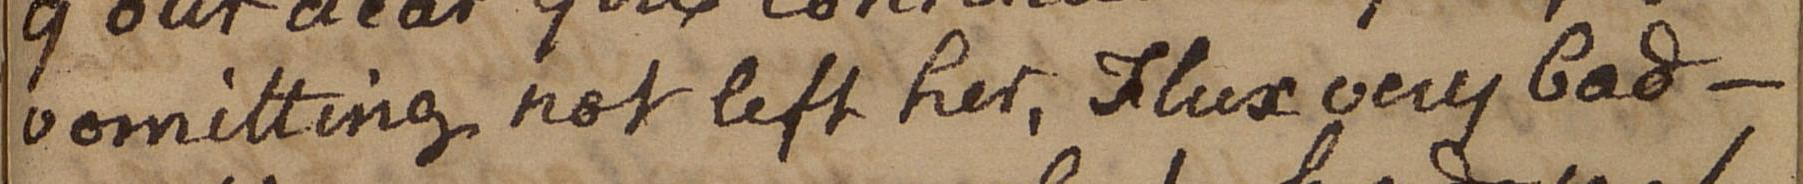vomitting not left her, Flux very bad-
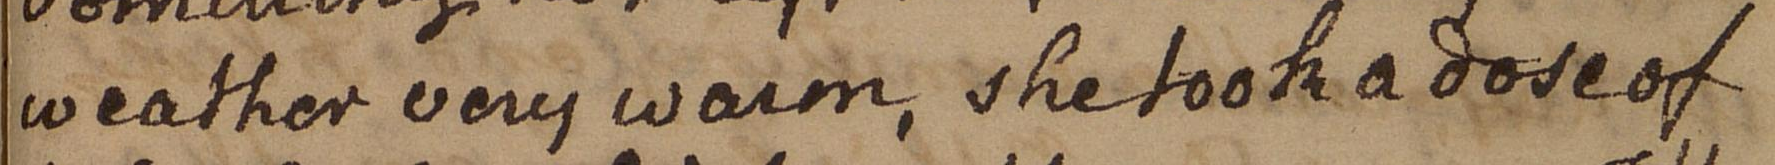weather very warm, she took a dose of
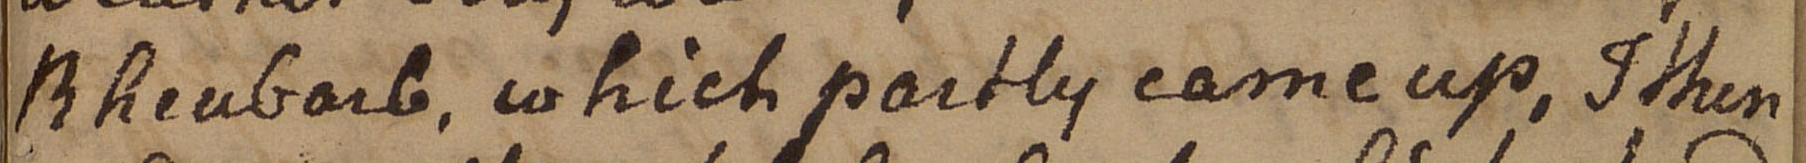Rheubarb, which partly came up, I then
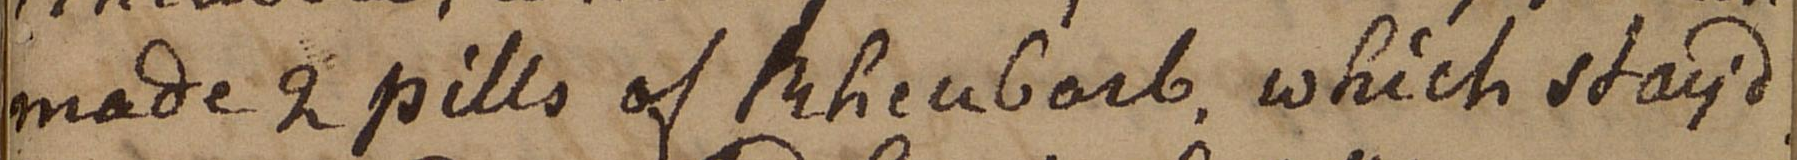made 2 pills of Rheubarb, which stay'd
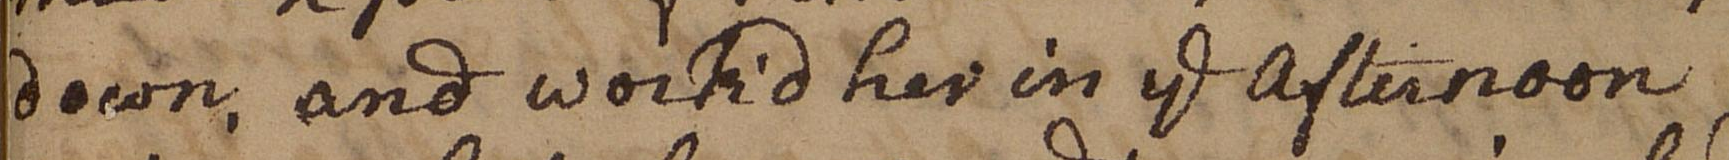down, and work'd her in y^e Afternoon
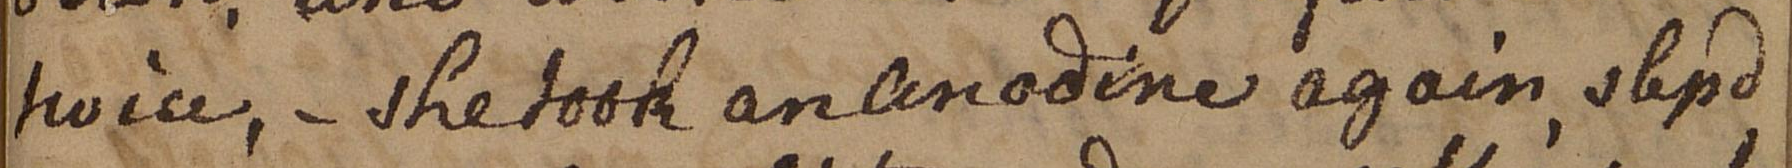twice,- she took an Anodine again, slepd
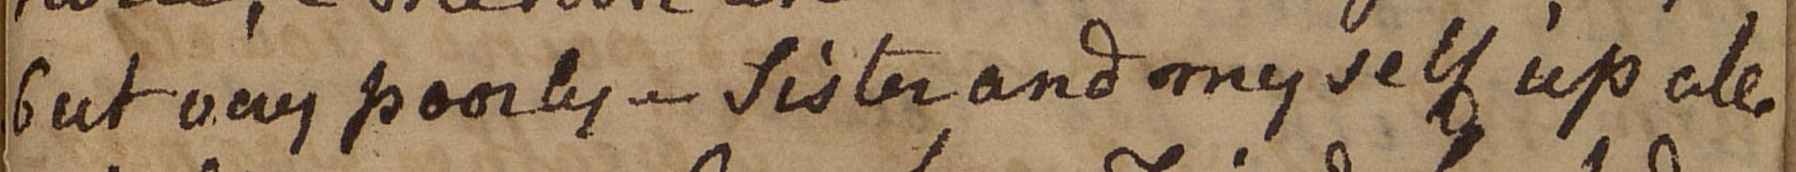but very poorly- Sister and my self up all
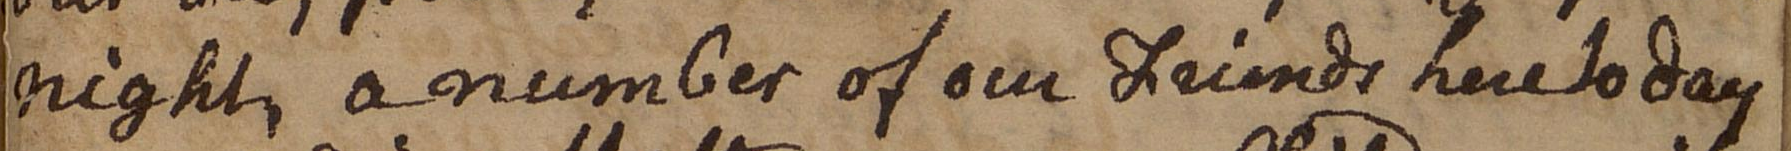night, a number of our Friends here to day
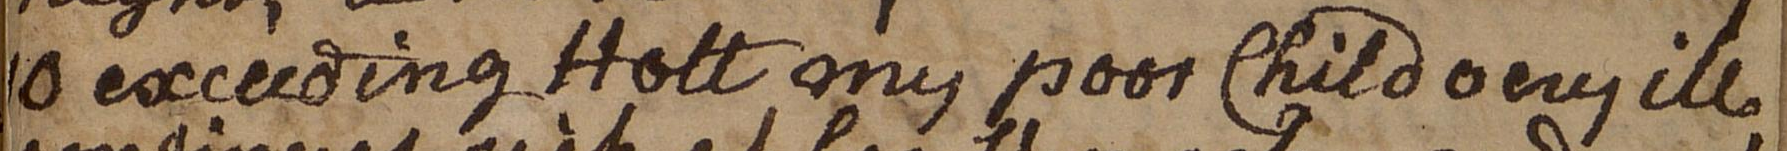10 exceeding Hott my poor Child very ill,
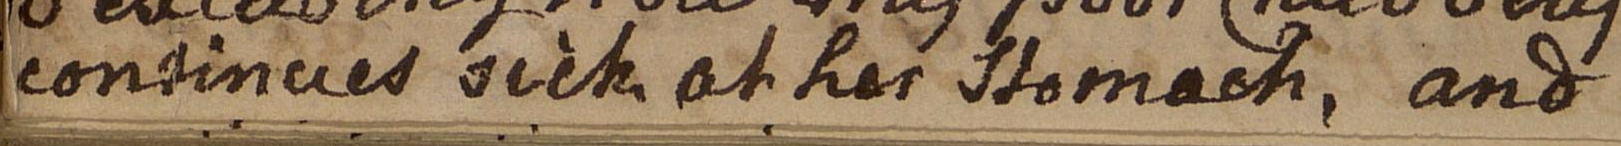continues sick at her Stomach, and
